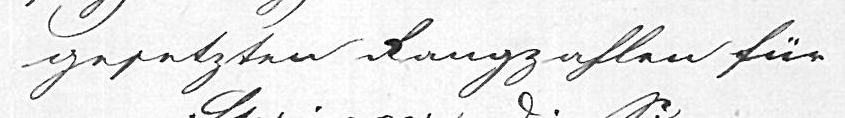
gesetzte Rangzahlen für
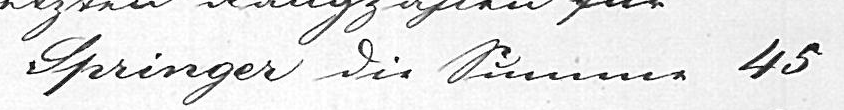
Springer die Summe 45
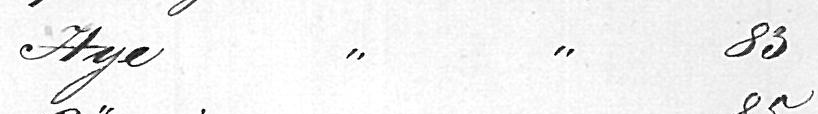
Hye " " 83
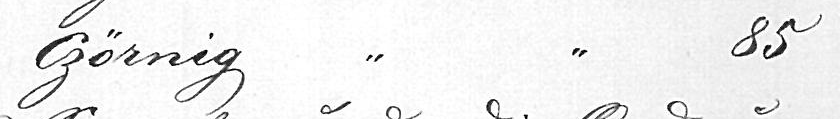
Czörnig " " 85
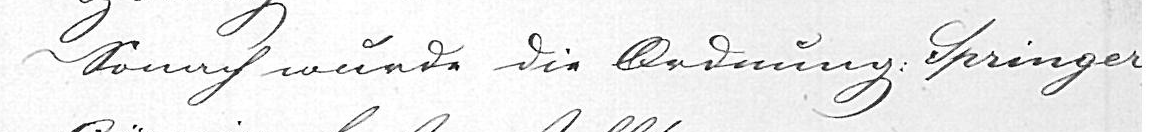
Sonach wurde die Ordnung: Springer,
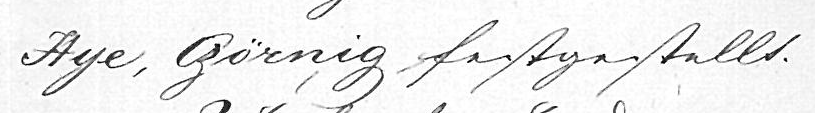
Hye, Czörnig festgestellt.
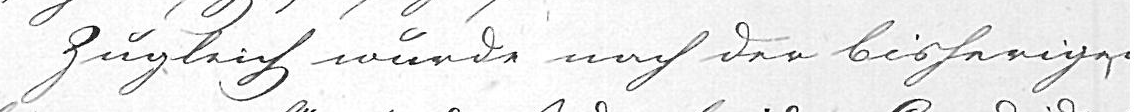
Zugleich wurde nach der bisherigen
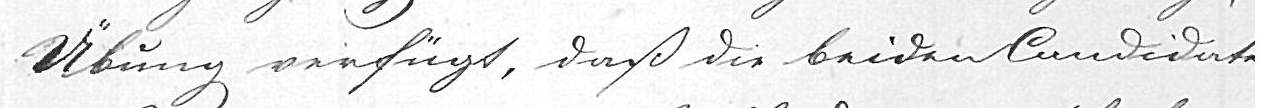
Übung verfügt, daß die beiden Candidaten
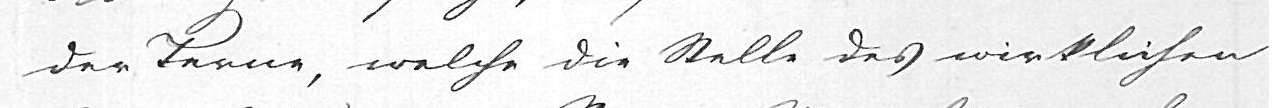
der Terne, welche die Stelle des wirklichen
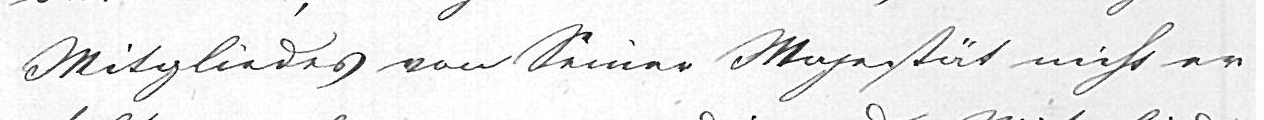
Mitgliedes von Seiner Majestät nicht er-
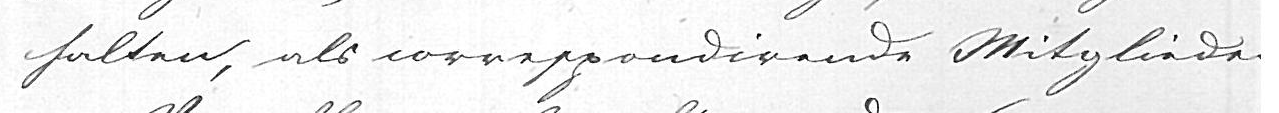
halten, als correspondirende Mitglieder
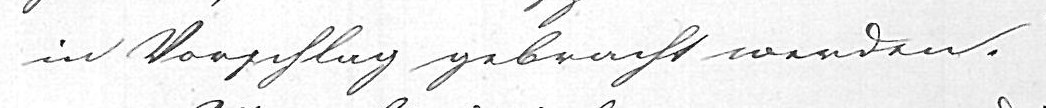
in Vorschlag gebracht werden.
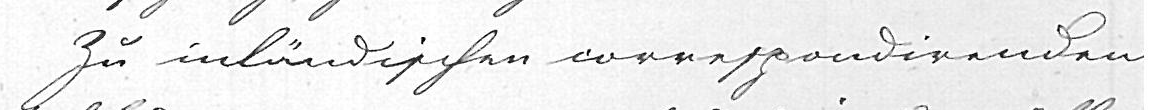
Zu inländischen correspondirenden
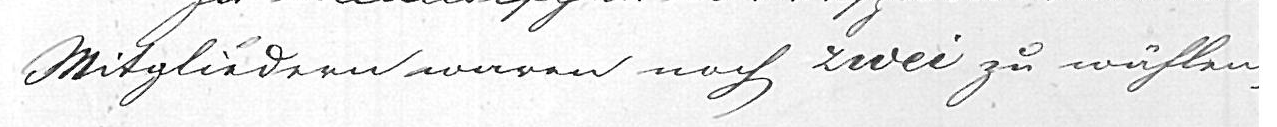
Mitgliedern waren noch zwei zu wählen,
